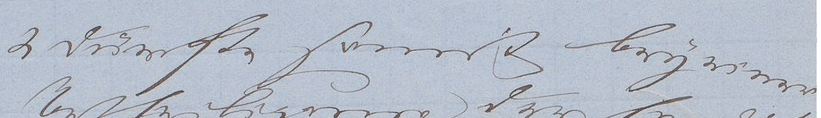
& dürfte somit bey einer
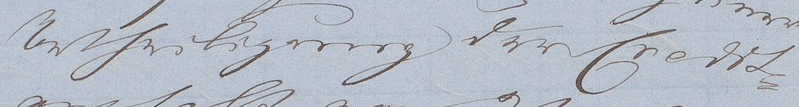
Betheiligung der Credit-
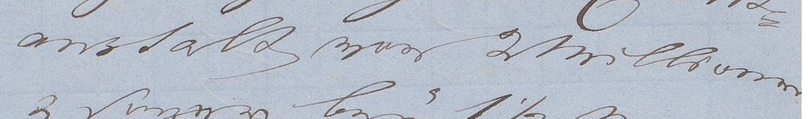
anstalt von 2 Millionen
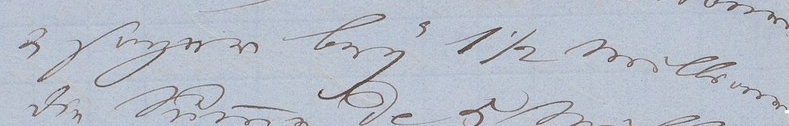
& sogar bey 1½ Millionen
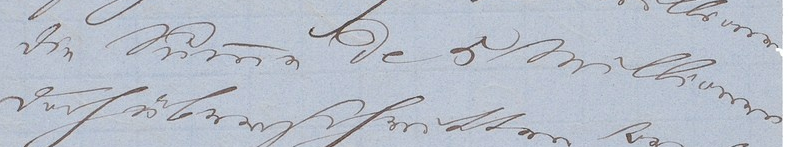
die Summe de 5 Millionen
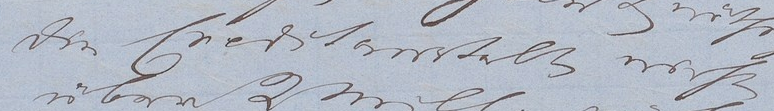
die Creditanstalt nicht
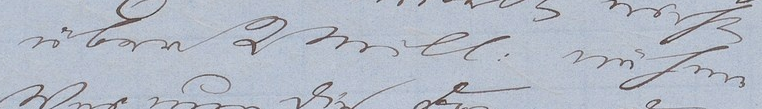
über 2 Mill. nähme.
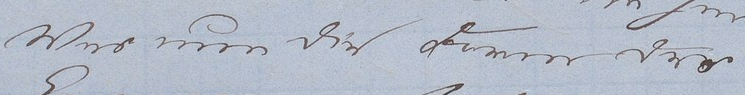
Was nun die Form des
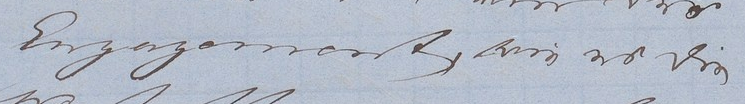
Engagements, wie es die
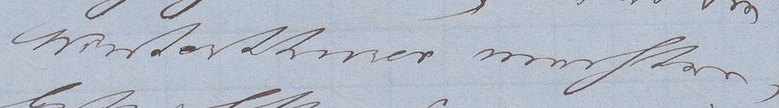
Winterthurer machten,
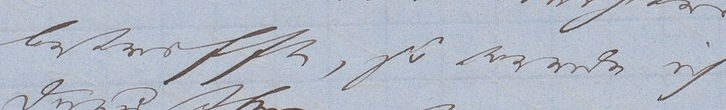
betrifft, so werde ich
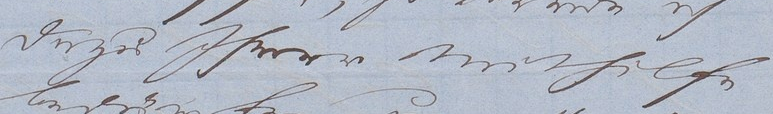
dazu Ihrer Mithilfe
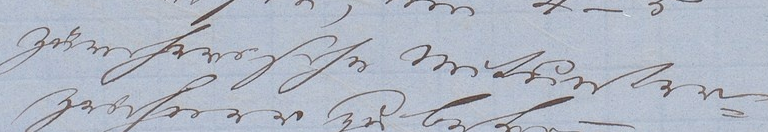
zürchersche Mitunter-
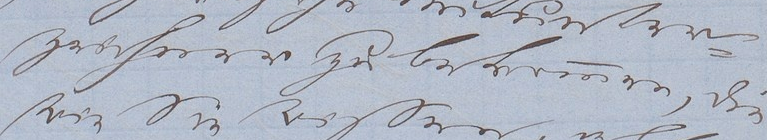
zeichner zu bekommen, die
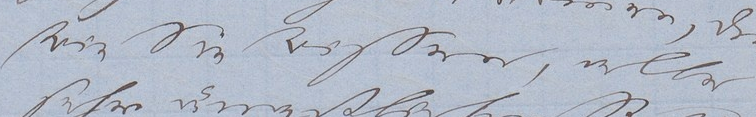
wie Sie wissen, alle
